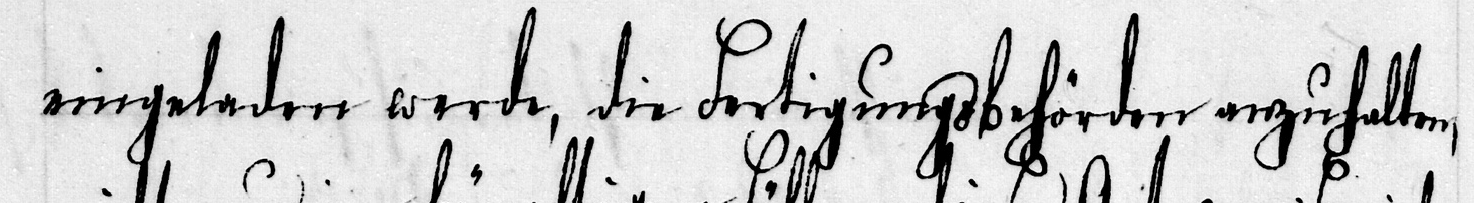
eingeladen werde, die Fertigungsbehörden anzuhalte¬
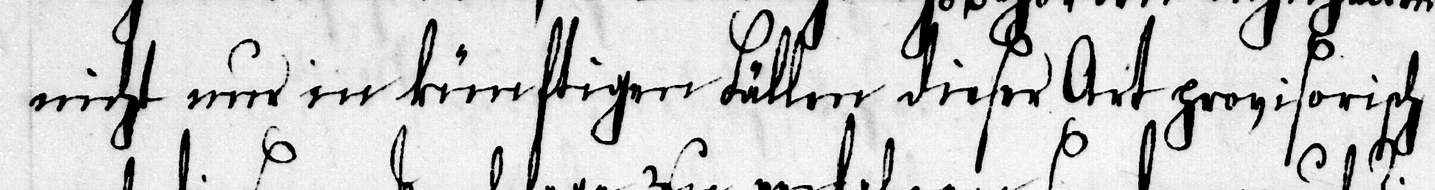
nicht nur in künftigen Fällen dieser Art provisorisch
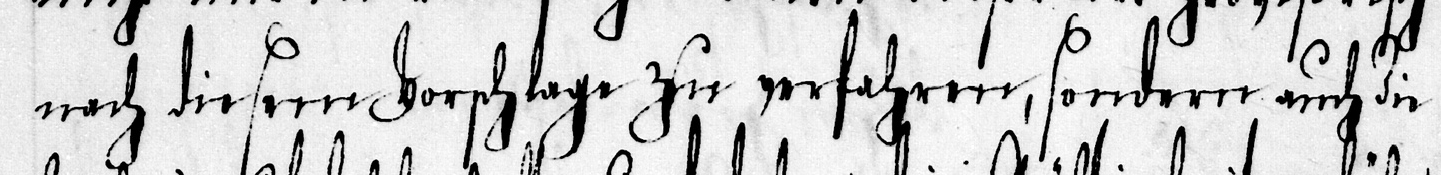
nach diesem Vorschlage zu verfahren, sondern auch die
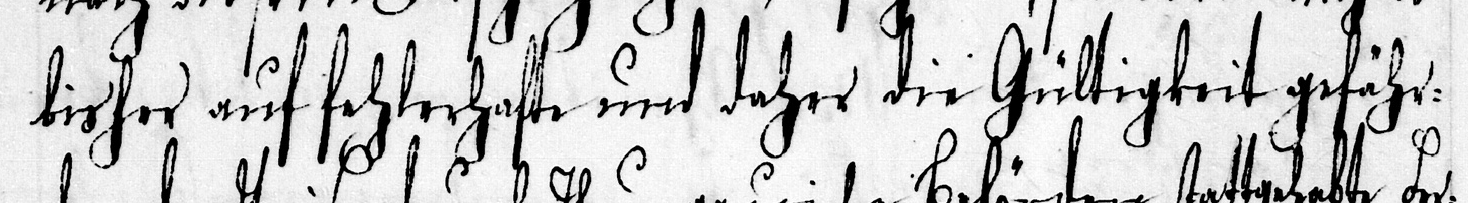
bisher auf fehlerhafte und daher die Gültigkeit gefähr¬
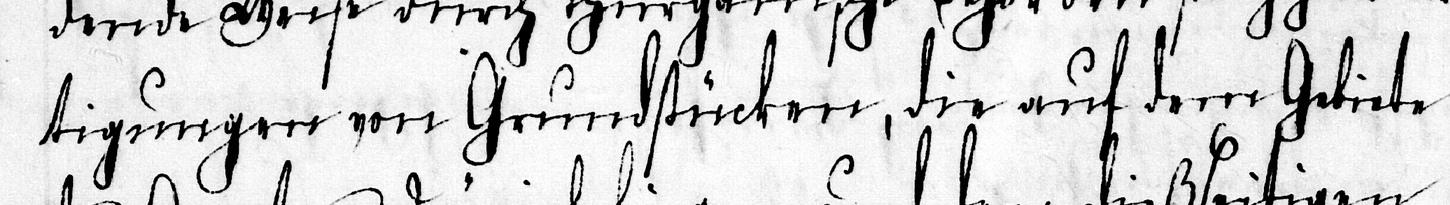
tigungen von Grundstücken, die auf dem Gebiete
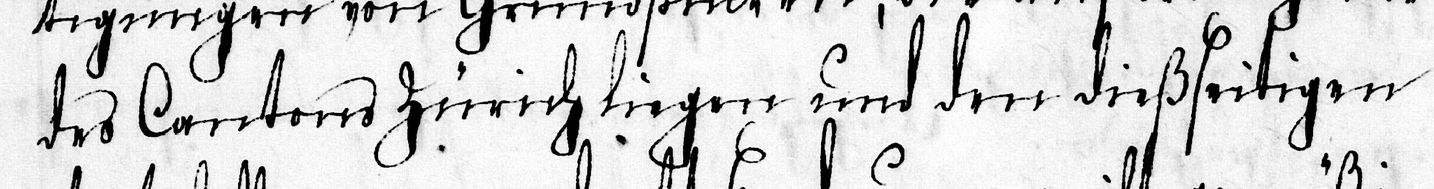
des Cantons Zürich liegen und den dießseitigen
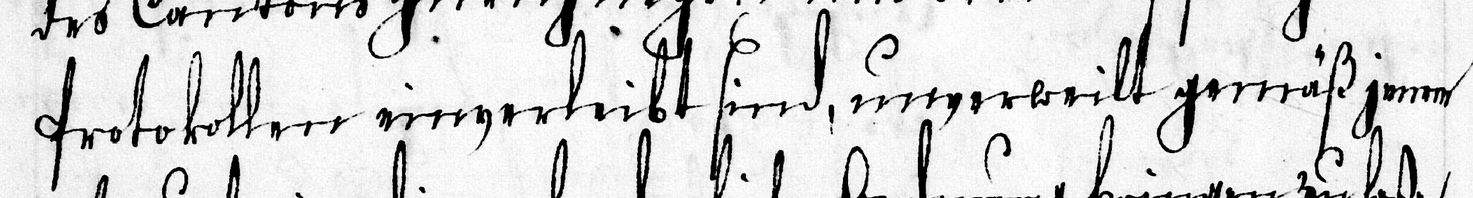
Protokollen einverleibt sind, unverweilt gemäß jenem
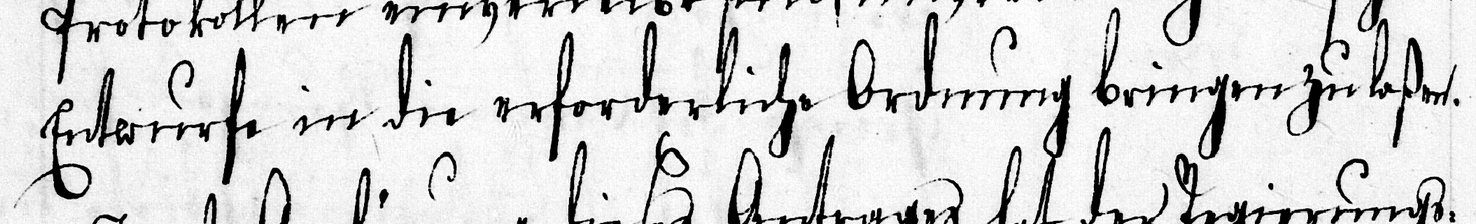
Entwurfe in die erforderliche Ordnung bringen zu laßen.
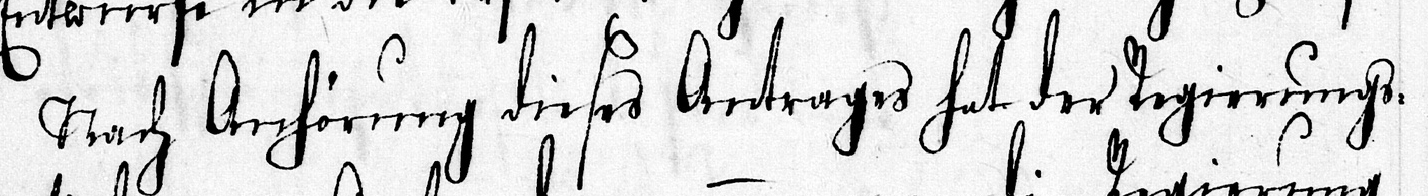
Nach Anhörung dieses Antrages hat der Regierungs¬
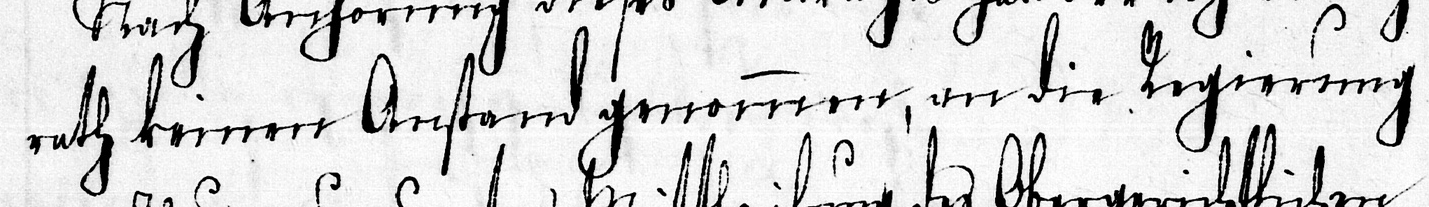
rath keinen Anstand genommen, an die Regierung
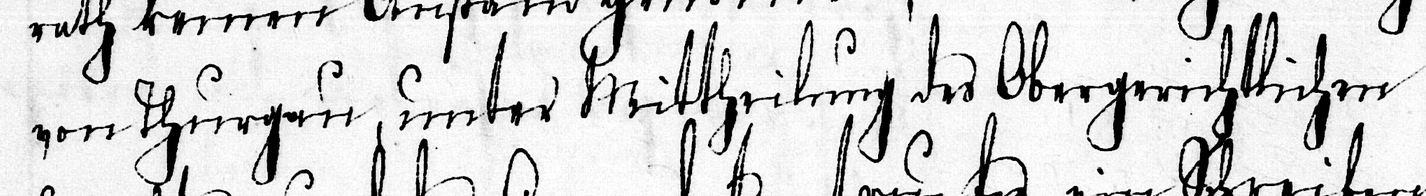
von Thurgau, unter Mittheilung des Obergerichtlichen
